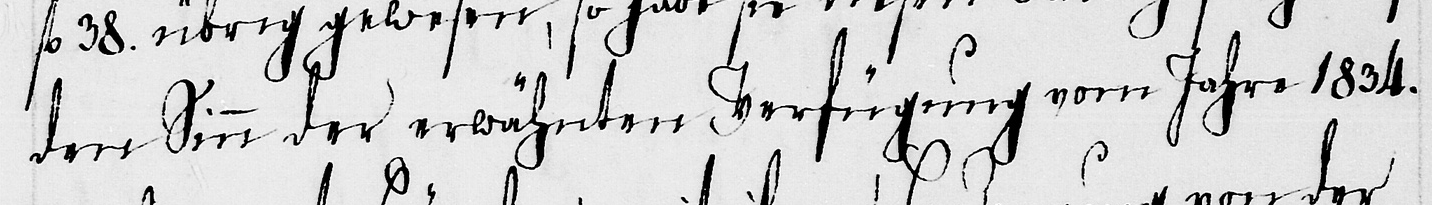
den Sinn der erwähnten Verfügung vom Jahre 1834.
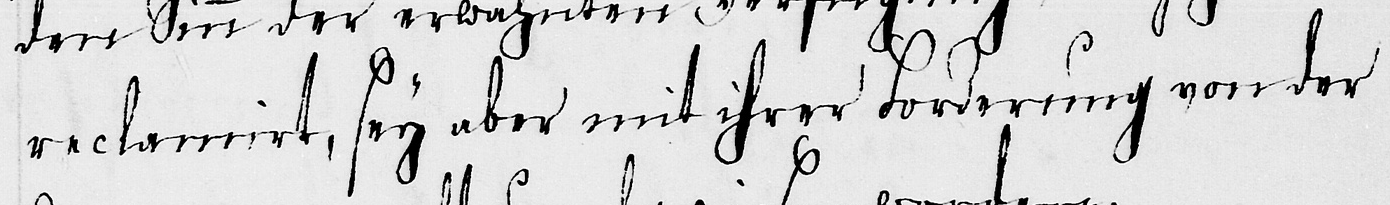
reclamirt, sey aber mit ihrer Forderung von der
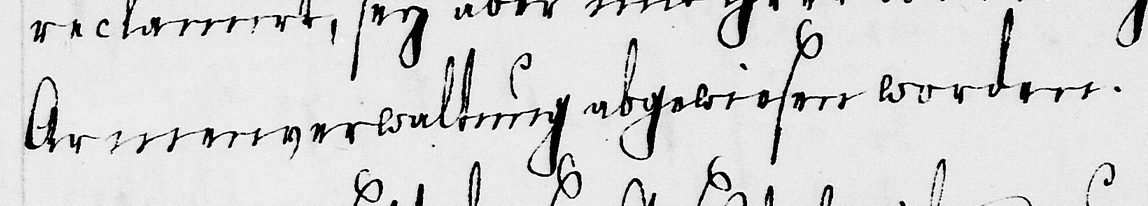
Armenverwaltung abgewiesen worden.
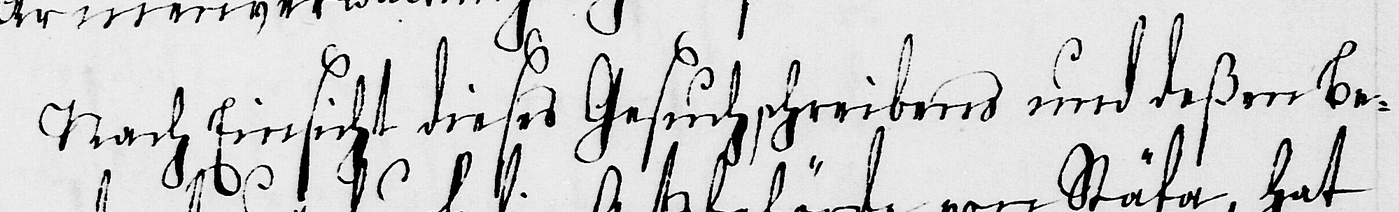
Nach Einsicht dieses Gesuchschreibens und deßen Be¬
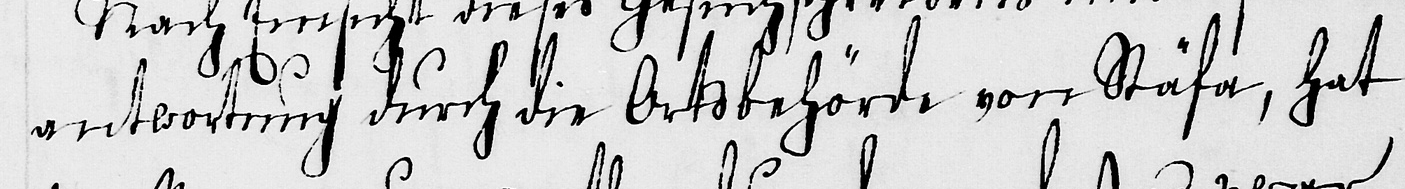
antwortung durch die Ortsbehörde von Stäfa, hat
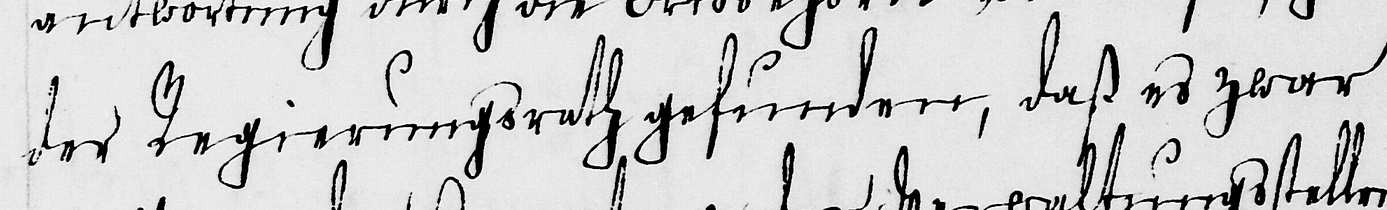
der Regierungsrath gefunden, daß es zwar
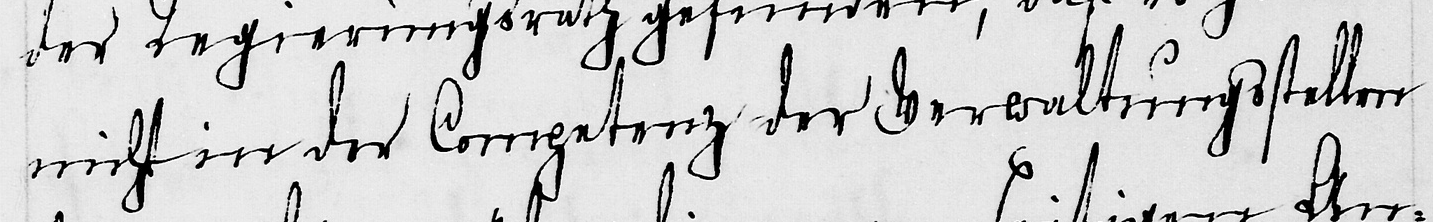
nicht in der Competenz der Verwaltungsstellen
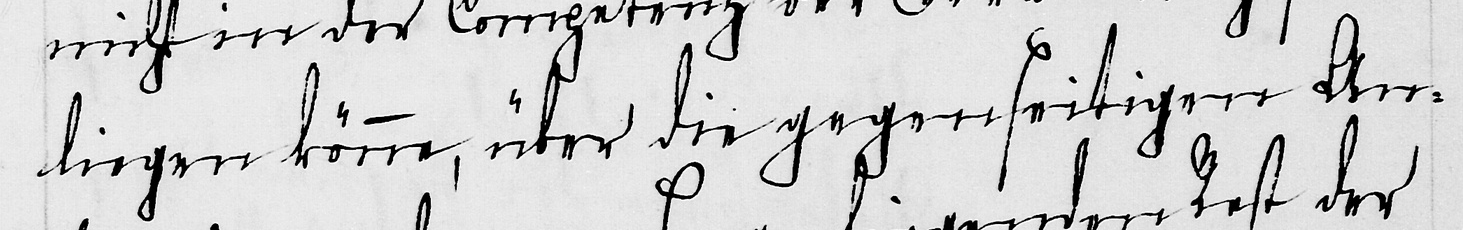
liegen könne, über die gegenseitigen An¬
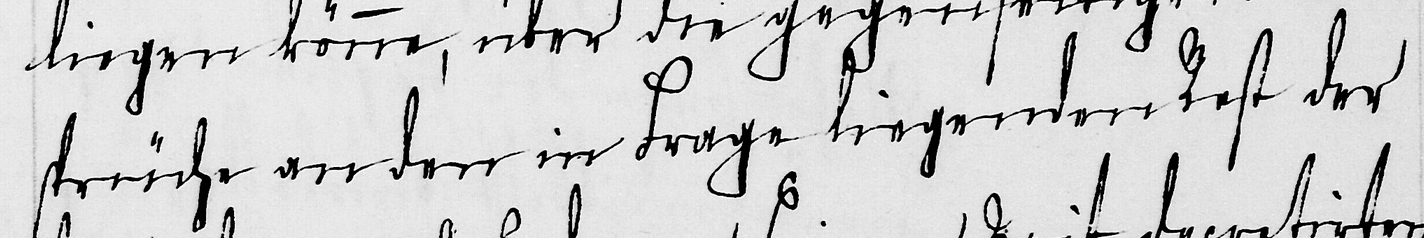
sprüche an den in Frage liegenden Rest der
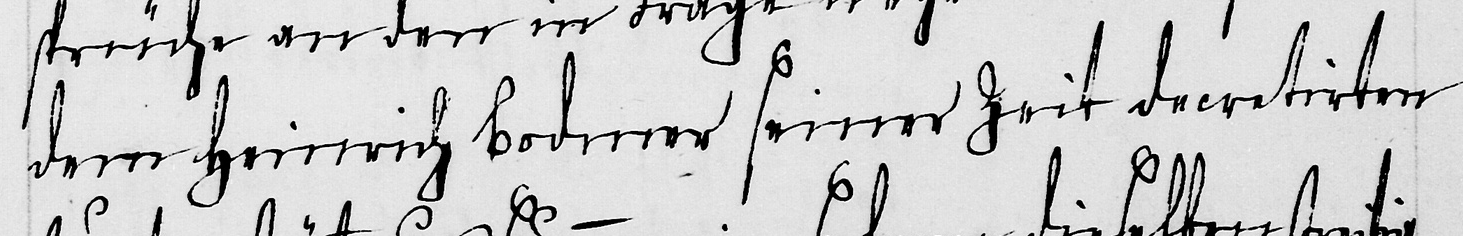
dem Heinrich Bodmer seiner Zeit decretirten
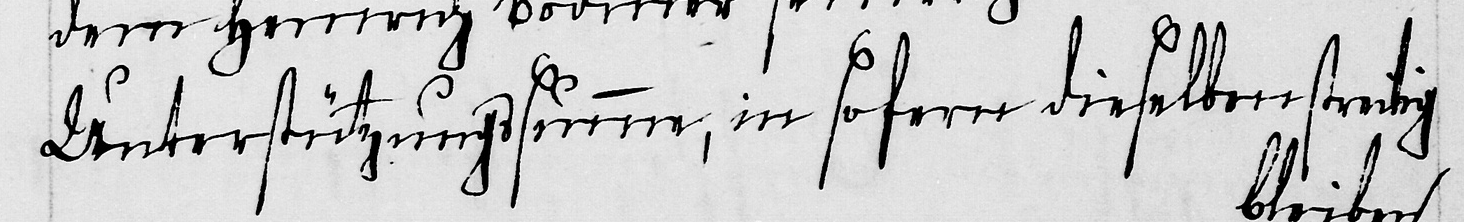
Unterstützungssumme, in sofern dieselben streitig
